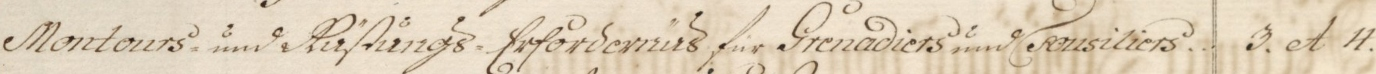Montours- und Rüstungs- Erfordernüs für Grenadiers und Fousiliers. 3. et 4.
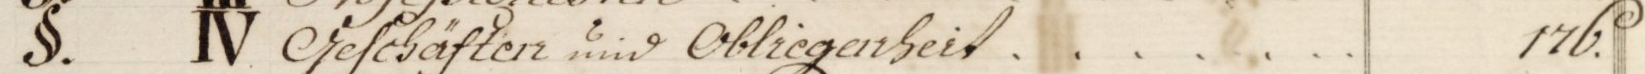§. IV Geschäften und Obliegenheit. 176.
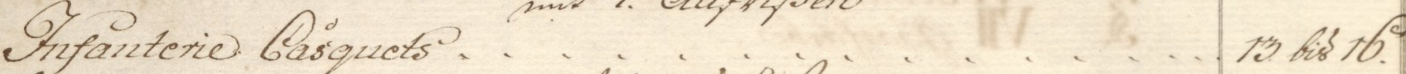Infanterie Casquets. 13. bis 16.
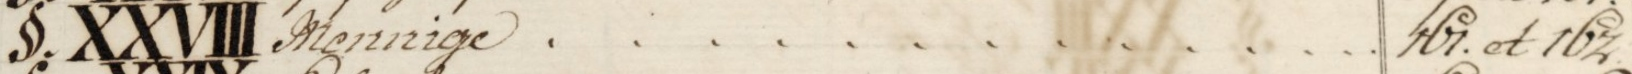§. XXVIII Mennige. 161. et 162.
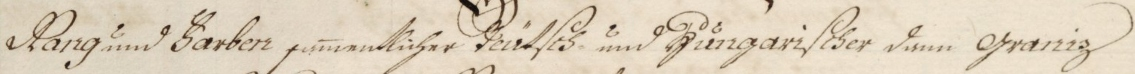Rang und Farben sammentlicher Teütsch- und Hungarischer dann Graniz
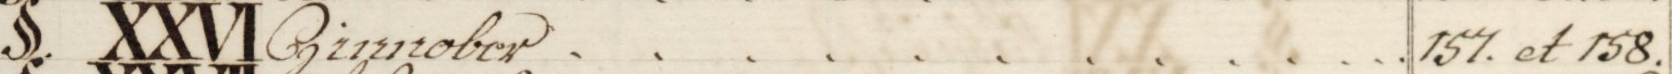§. XXVI Zinnober. 157. et 158.
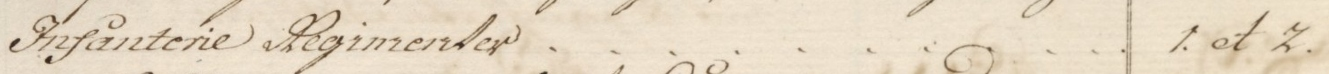Infanterie Regimenter. 1. et 2.
